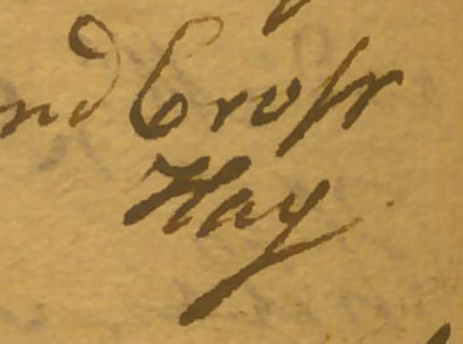Hay
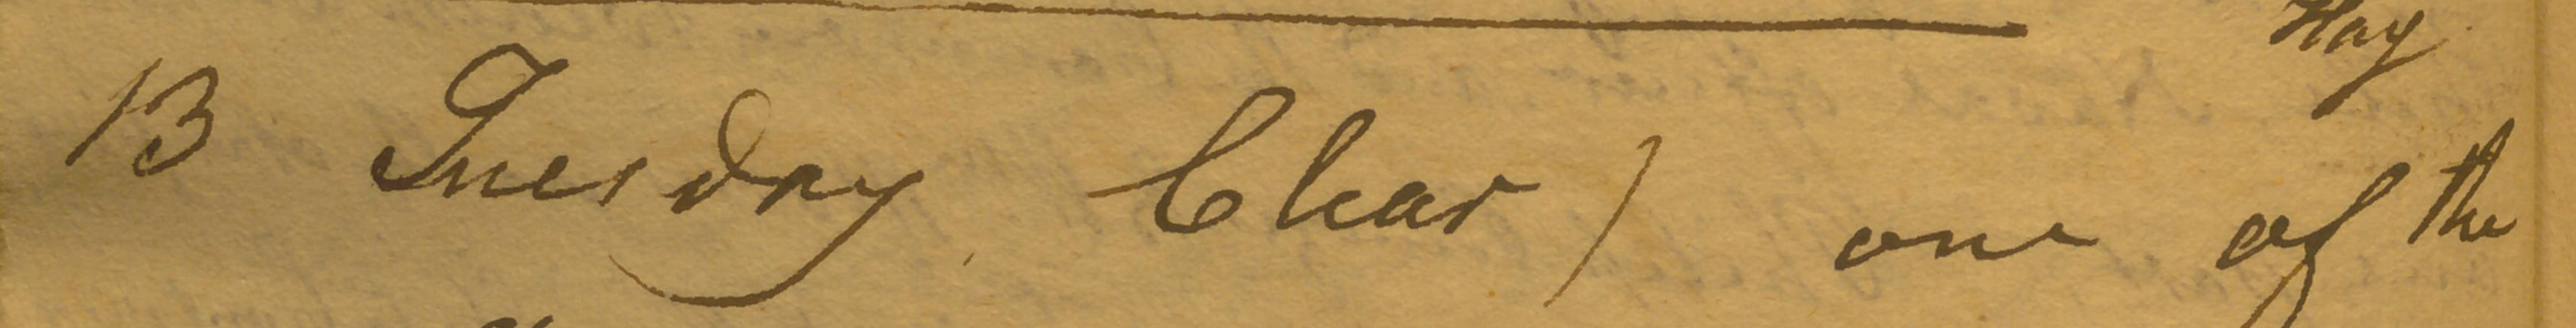13 Tuesday Clear) one of the
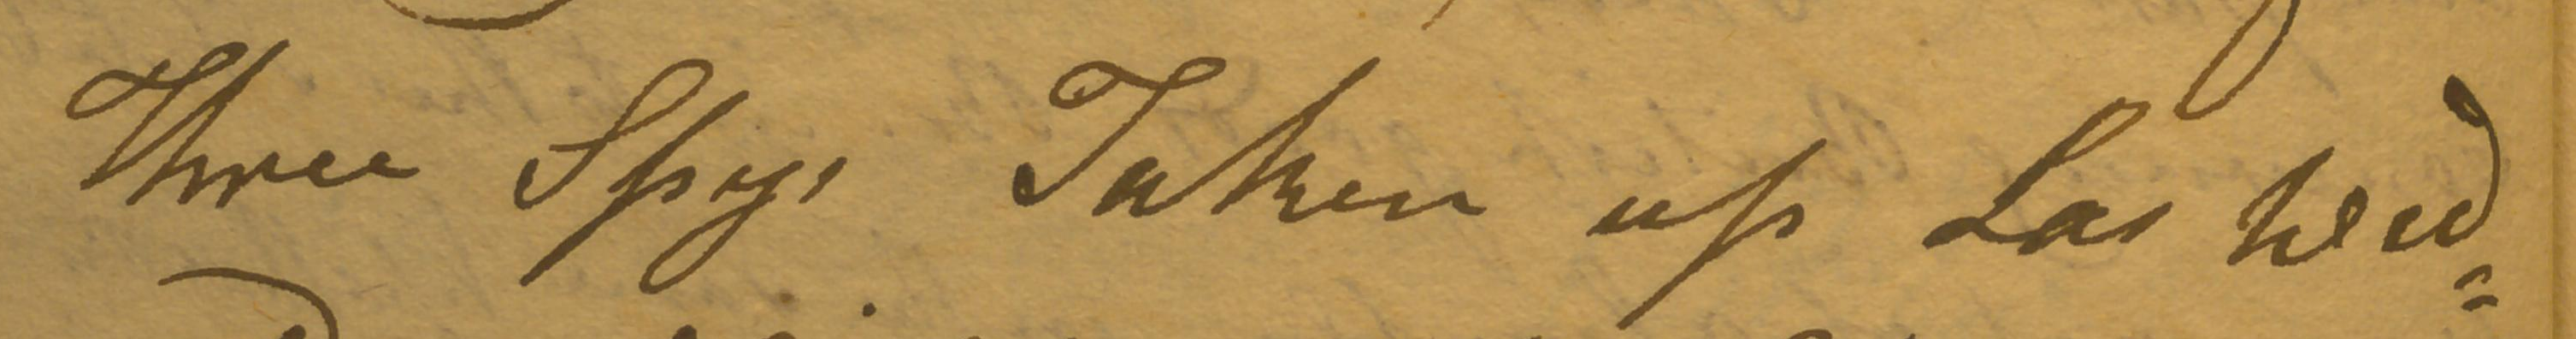Three spys Taken up Las wed
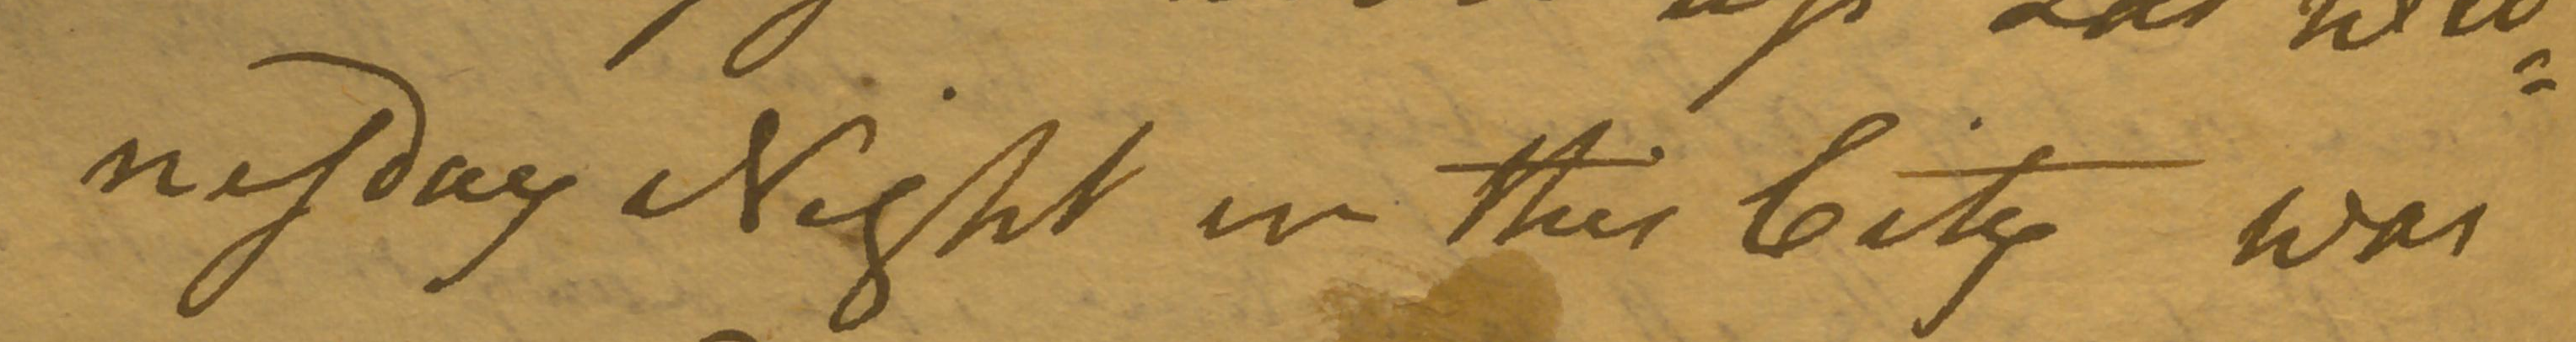nesday Night in this City, was
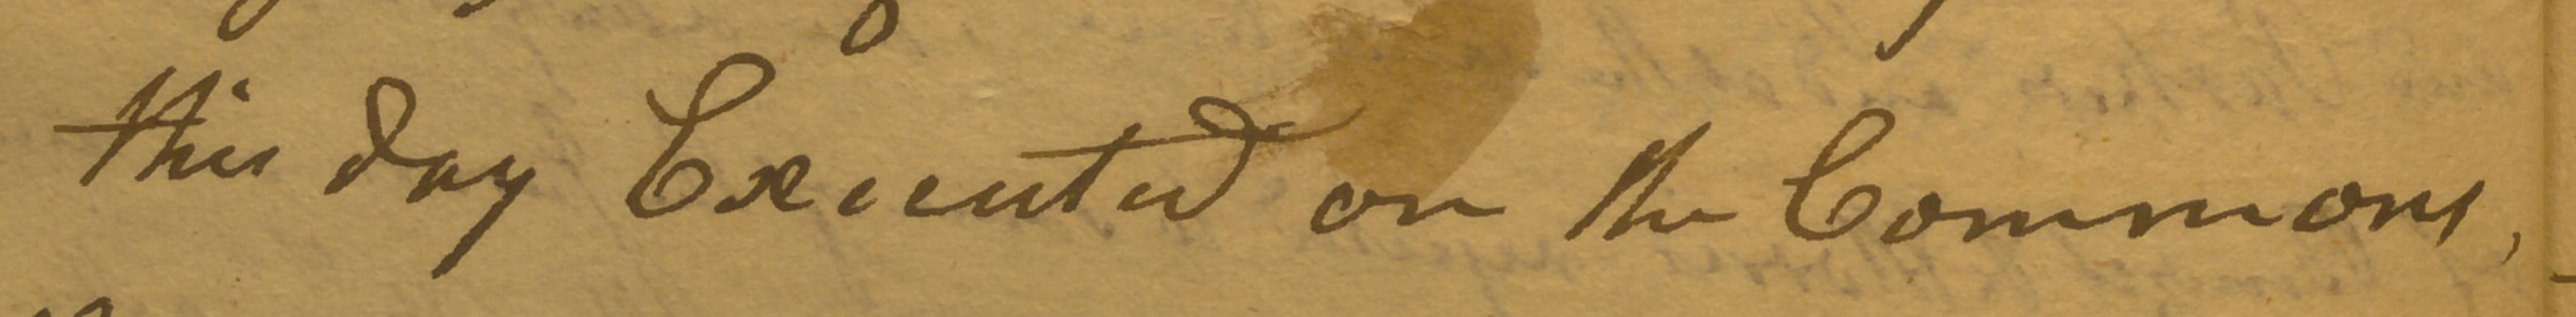this day Executed on the Commons
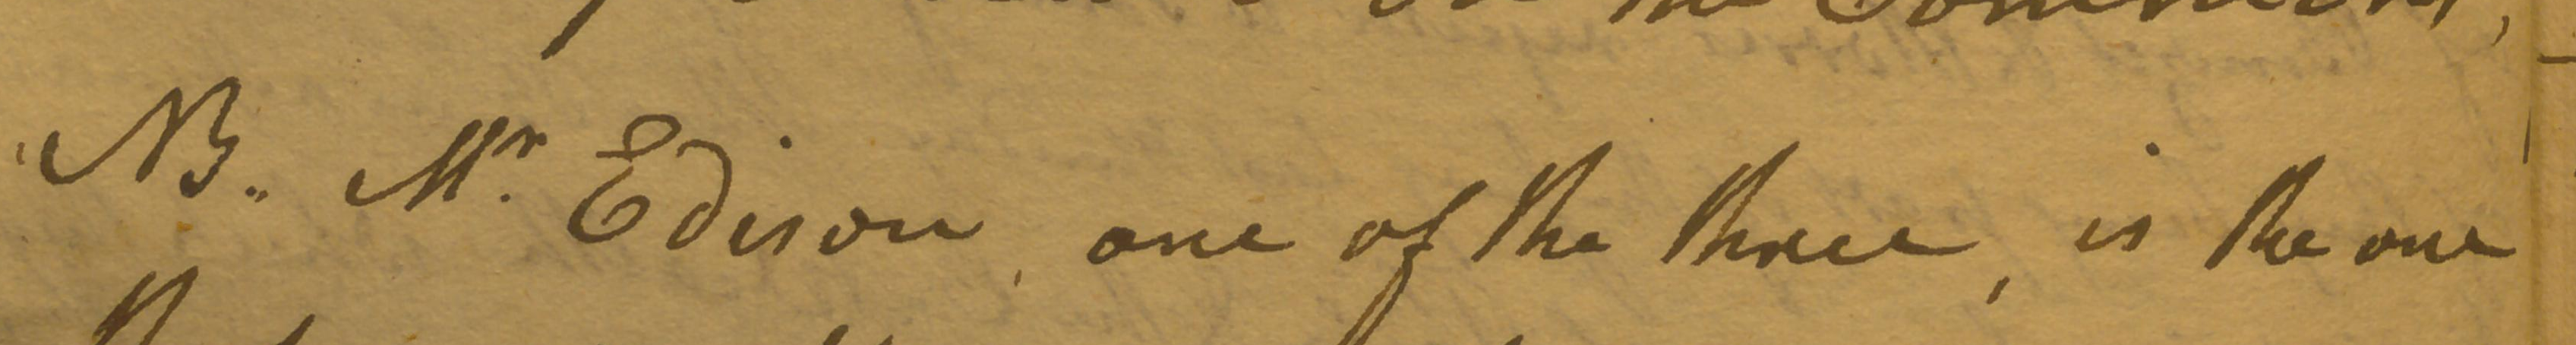NB. M^r. Edison one of the three is the one
